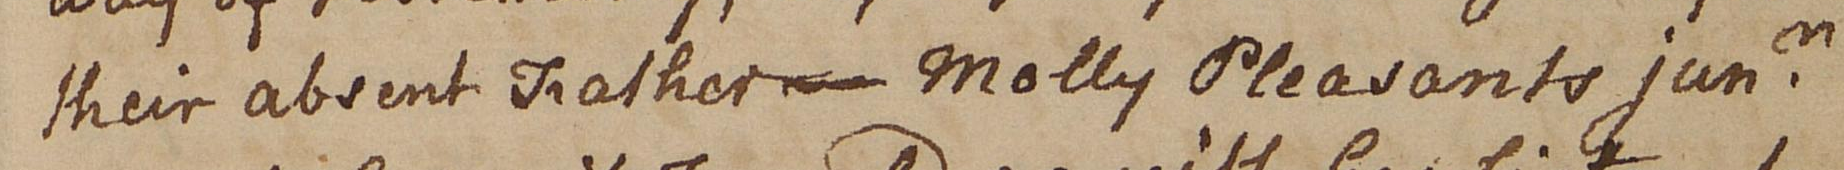their absent Father- Molly Pleasants jun^r.
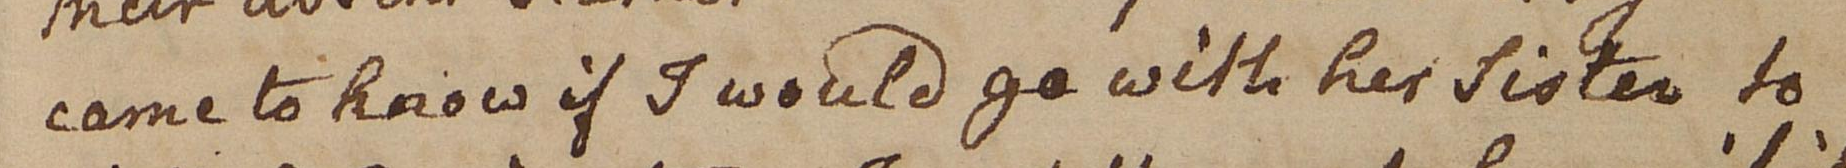came to know if I would go with her Sister to
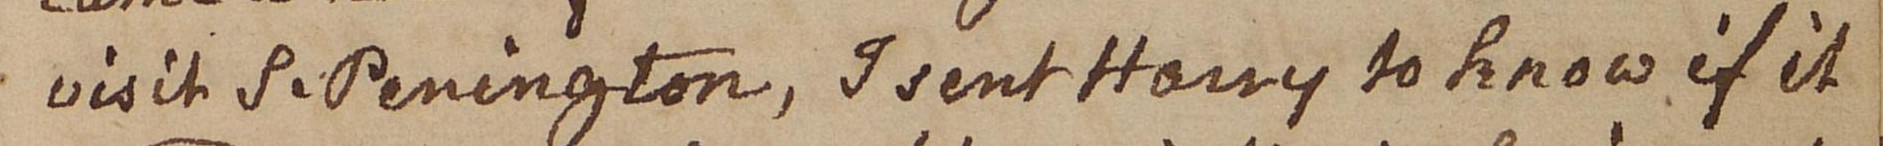visit P. Penington, I sent Harry to know if it
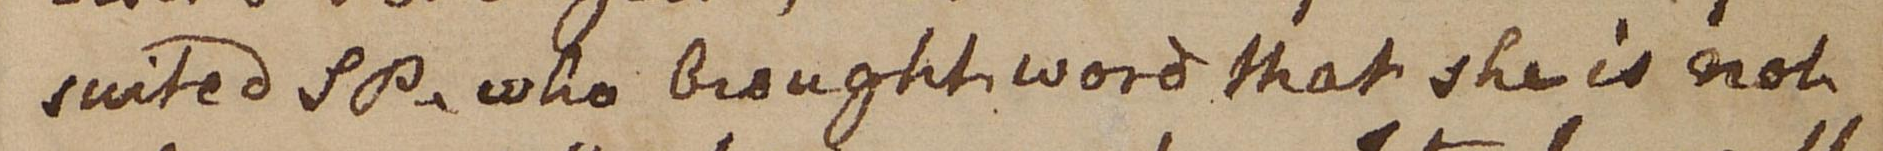suited SP- who brought word that she is not
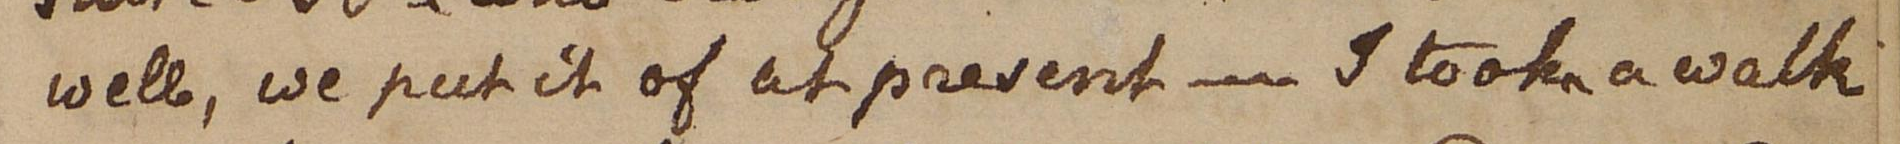well, we put it of at present- I took a walk
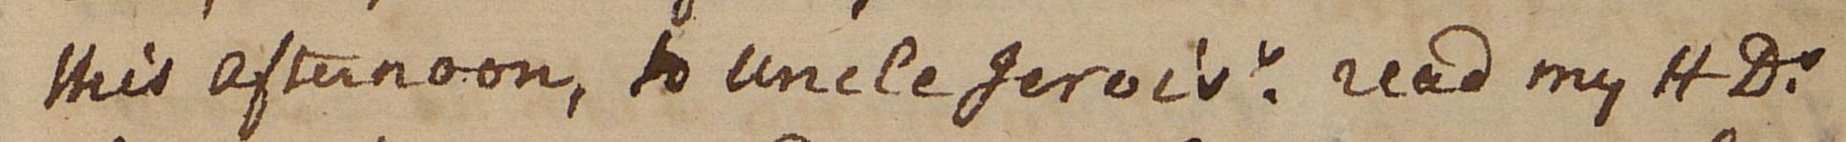this afternoon, to Uncle Jervis^s. read my H D^s.
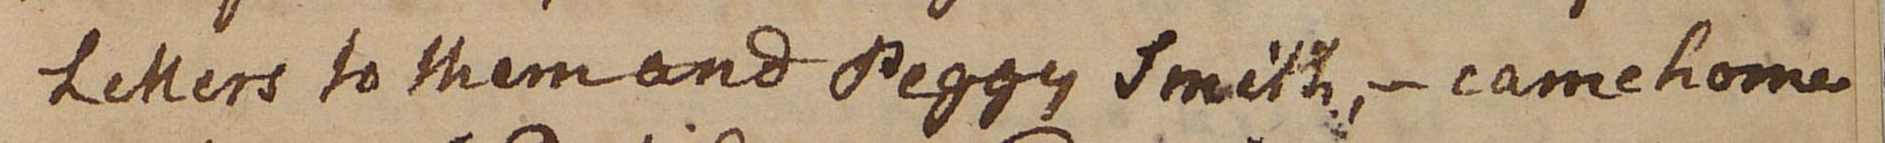Letters to them and Peggy Smith,- came home
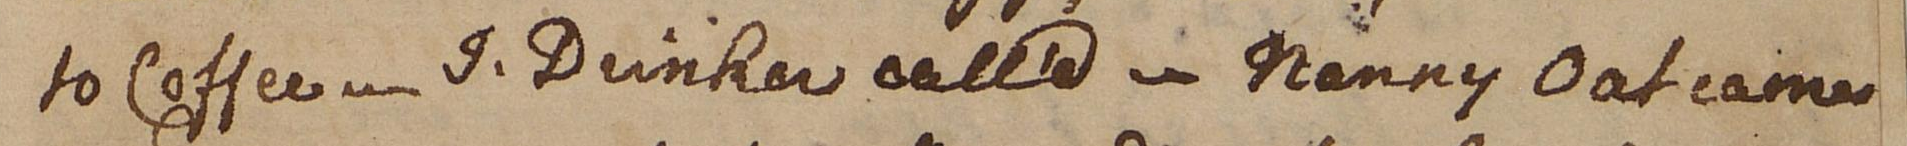to Coffee- J. Dunker calll'd- Nanny Oat came
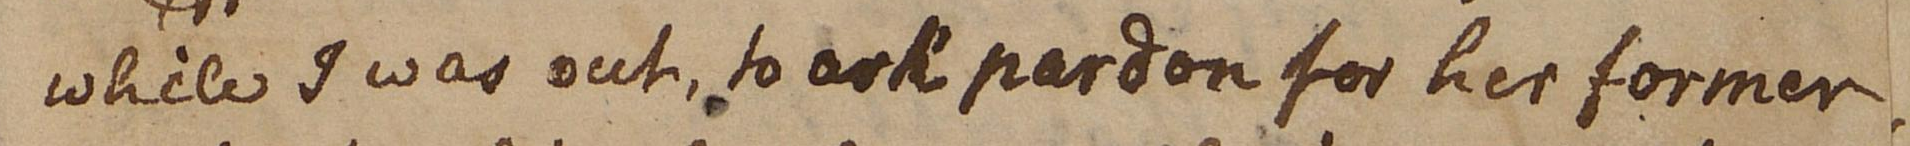while I was out, to ask pardon for her former
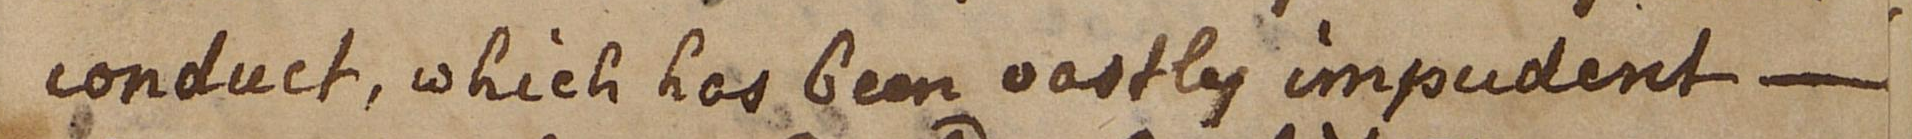conduct, which has been vastly impudent-
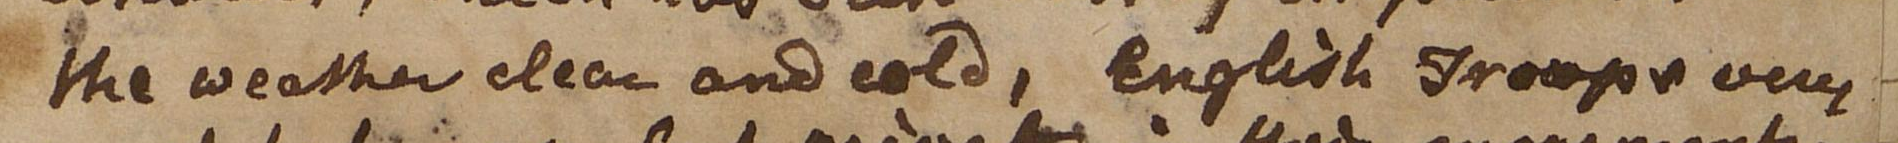the weather clear and cold, English Troops very
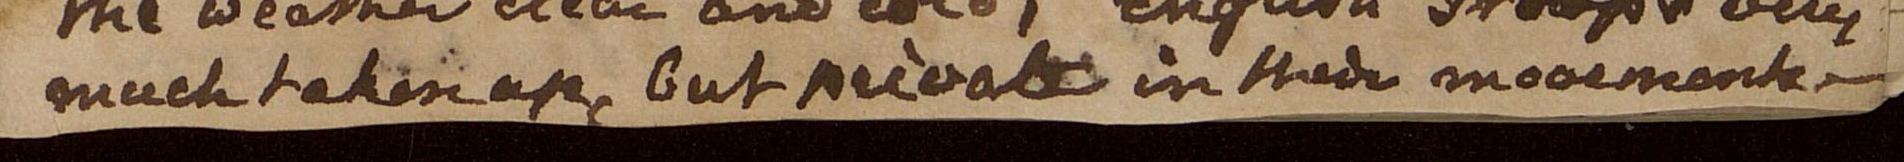much taken up, but privall in their movement-
